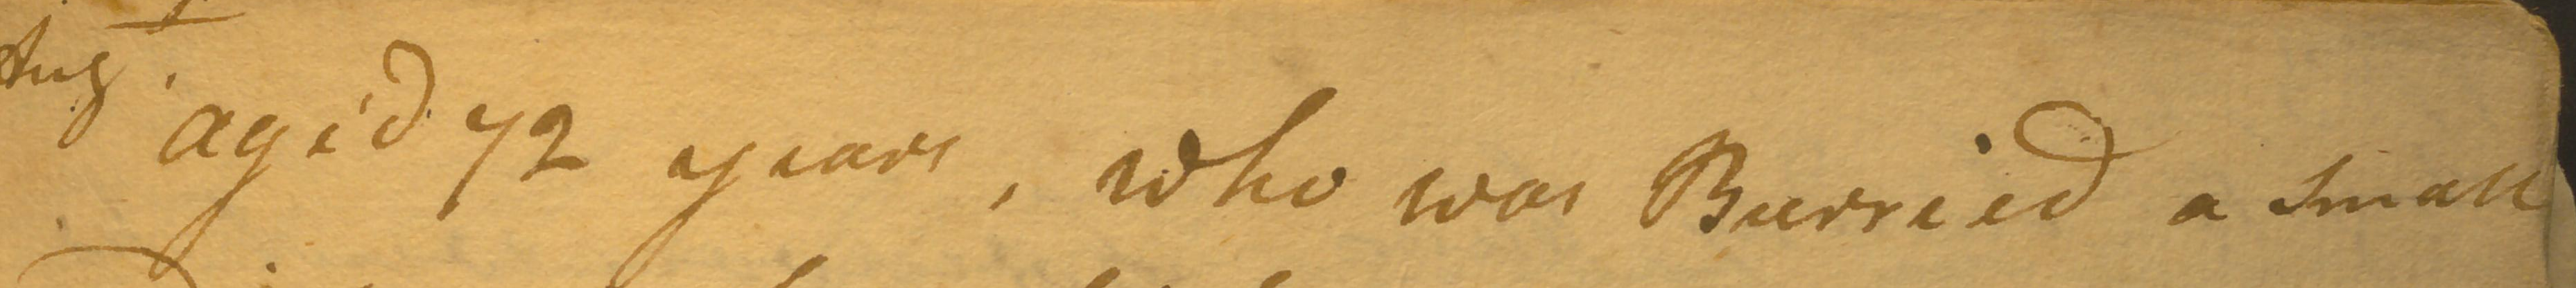aged 72 years, who was Burried a small
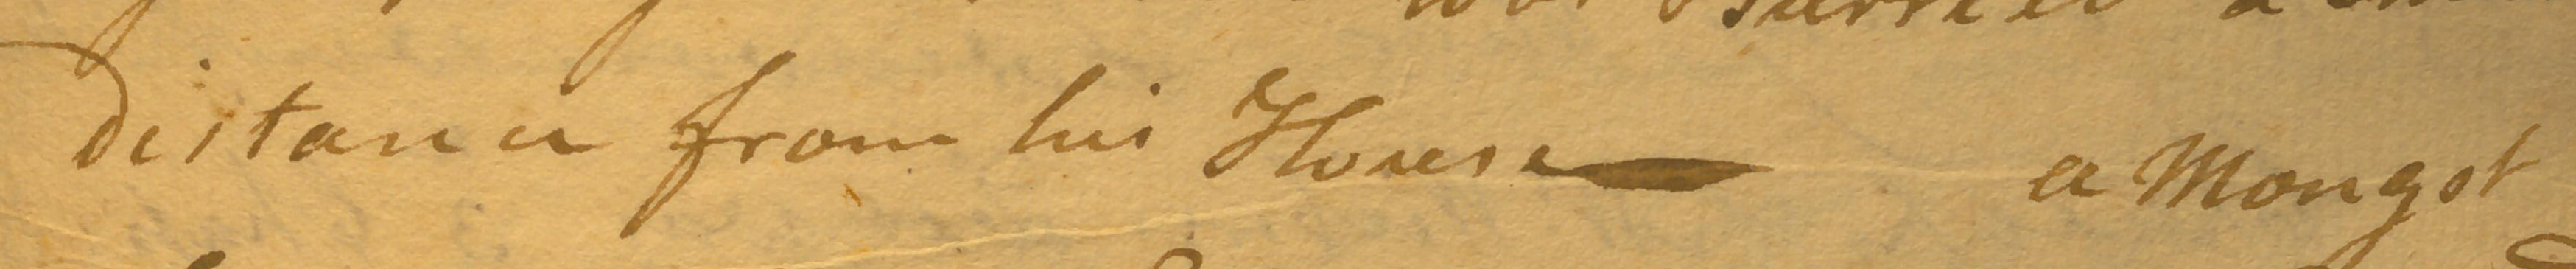distance from his House a Mongst
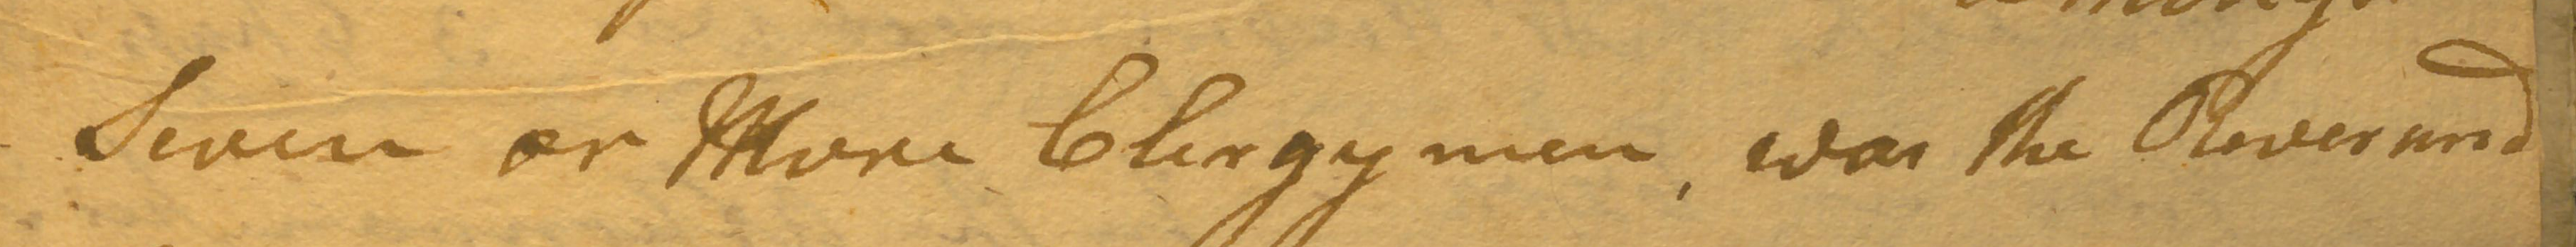Seven or More Clergymen was the Reverand
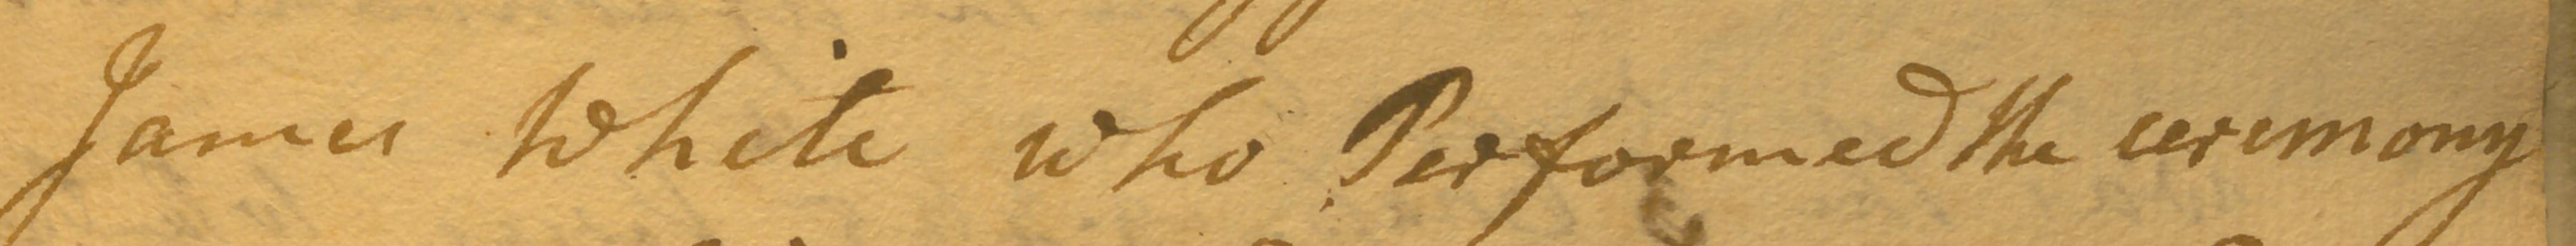James White who Performed the ceremony
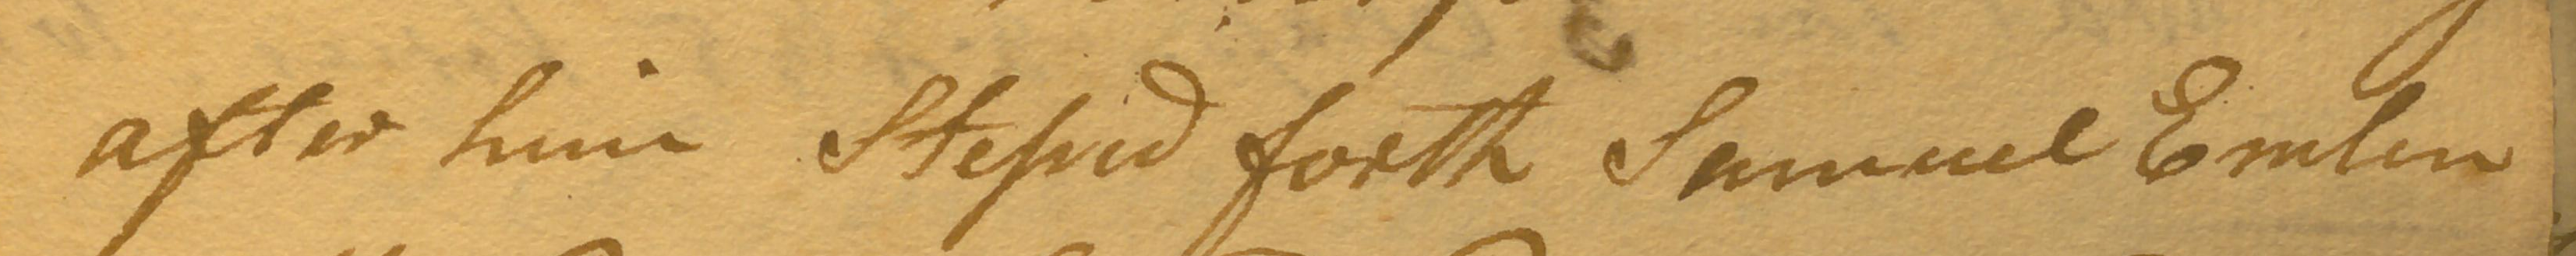after him Steped forth Samuel Emlen
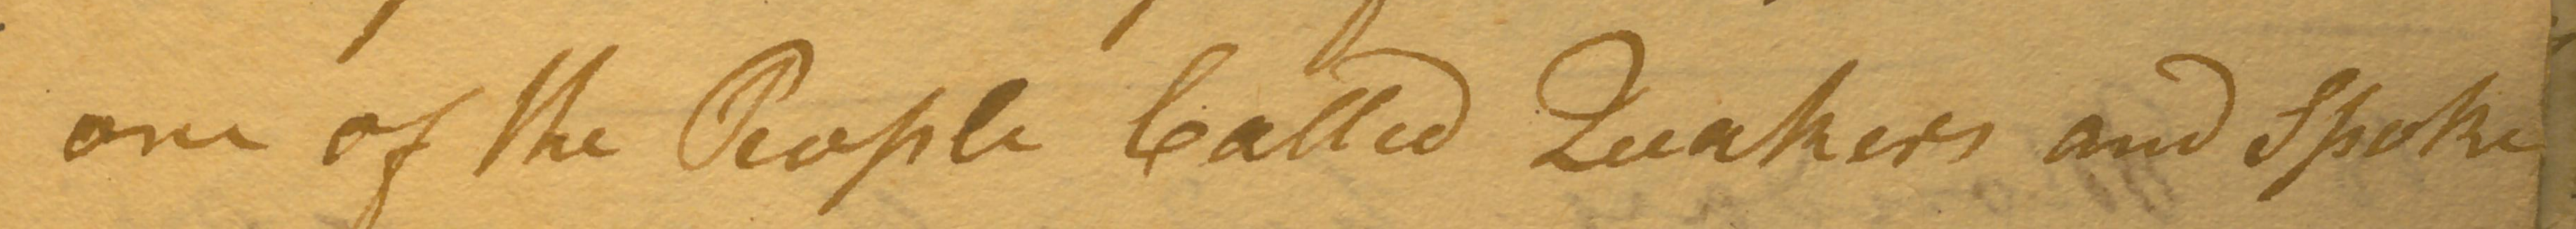one of the People Called Quakers and spoke
